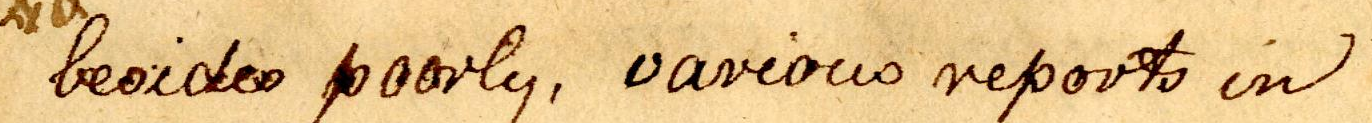besides poorly, various reports in
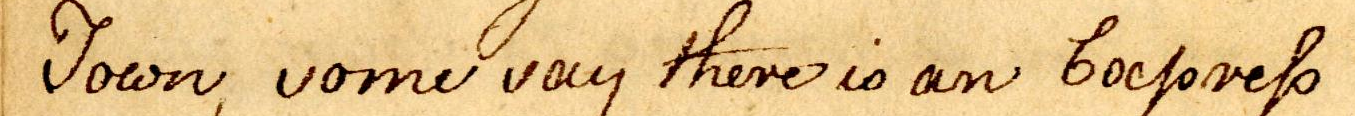Town, some say there is an Express
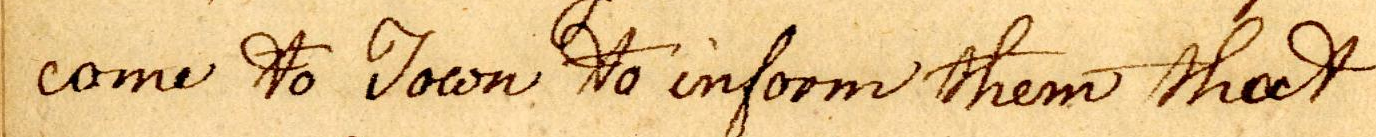come to Town to inform them that
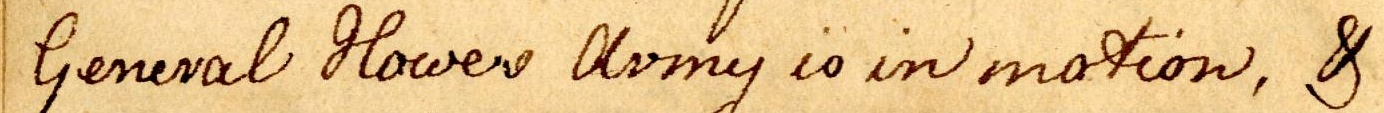General Howes Army is in motion, &
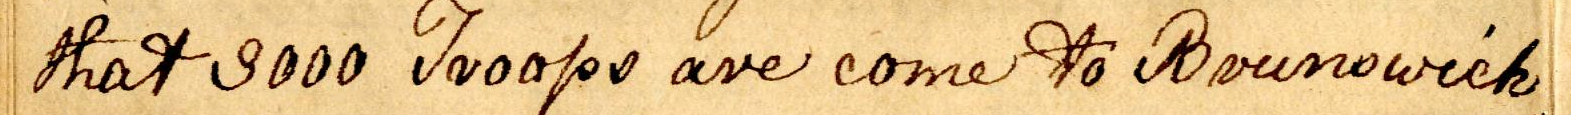that 3000 Troops are come to Brunswick
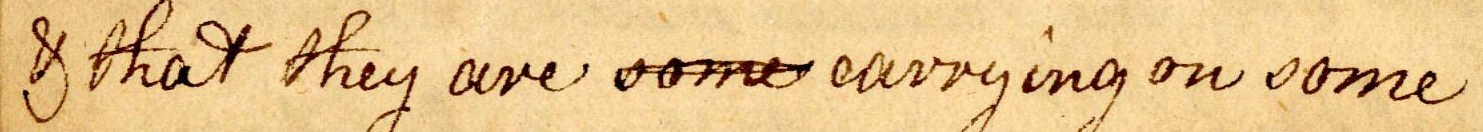& that they are [some] carrying on some
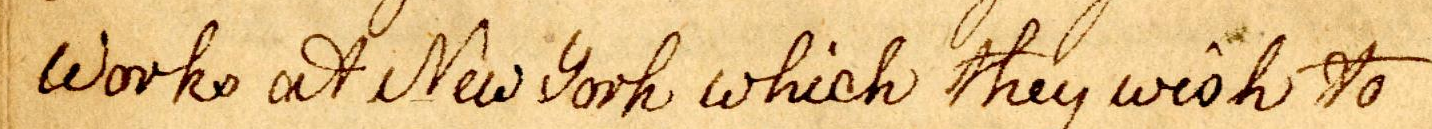Works at New York which they wish to
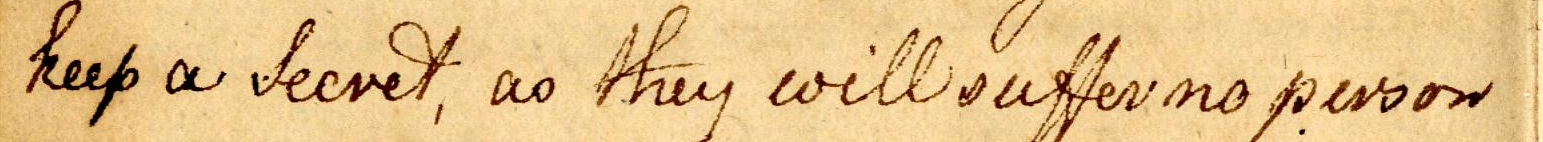keep a Secret, as they will suffer no person
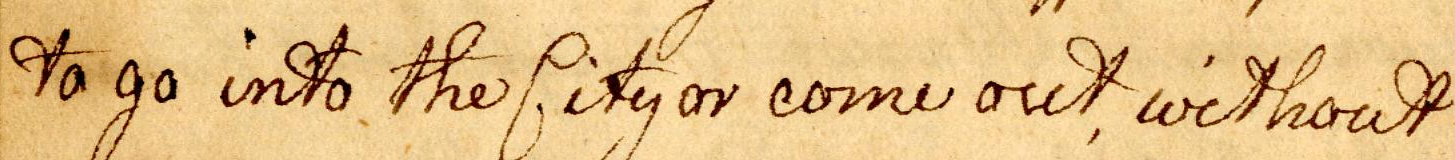to go into the City or come out, without
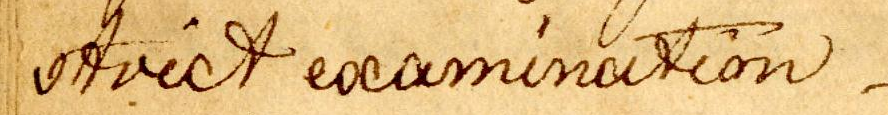strict examination-
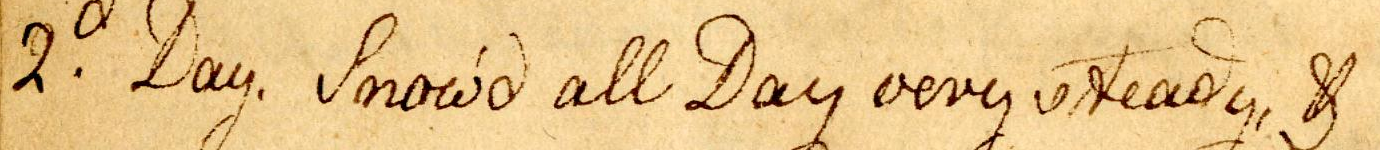2^d Day. Snow'd all Day very steady, &
